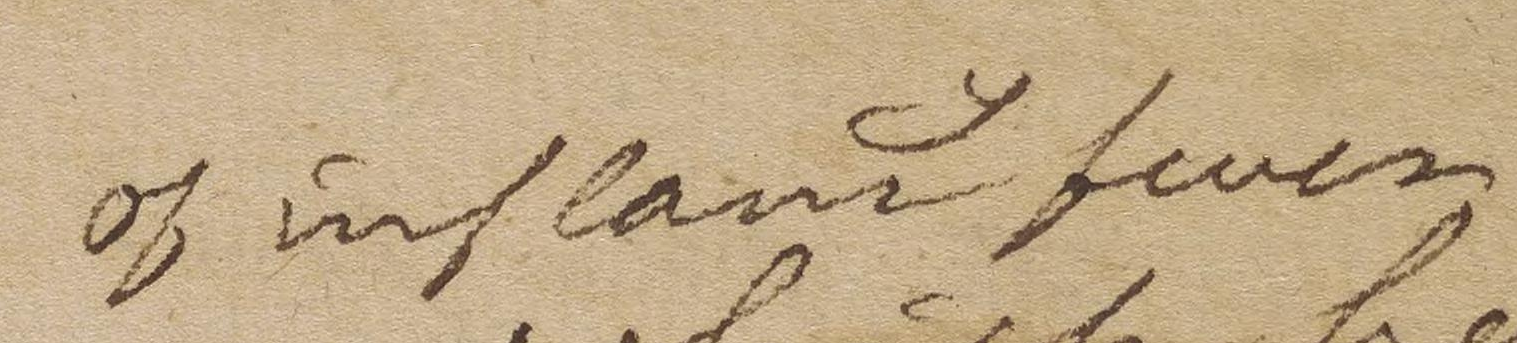of inflam^y fever
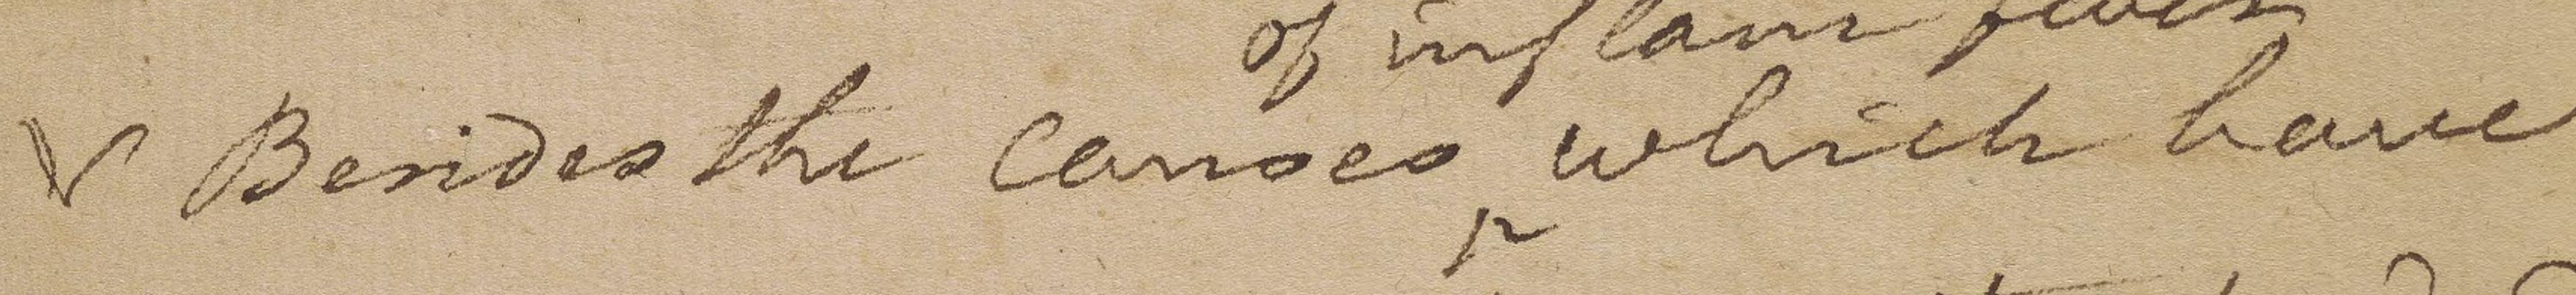V Besides the cases ^ which have
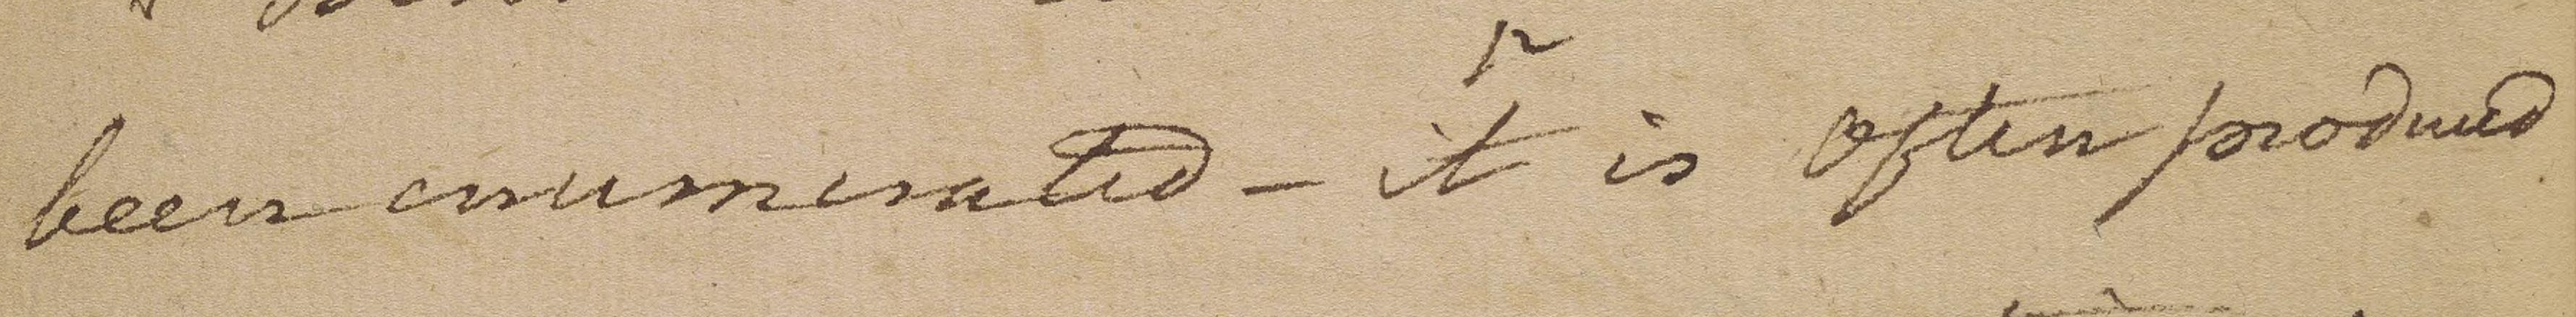been enumerated, it is often produced
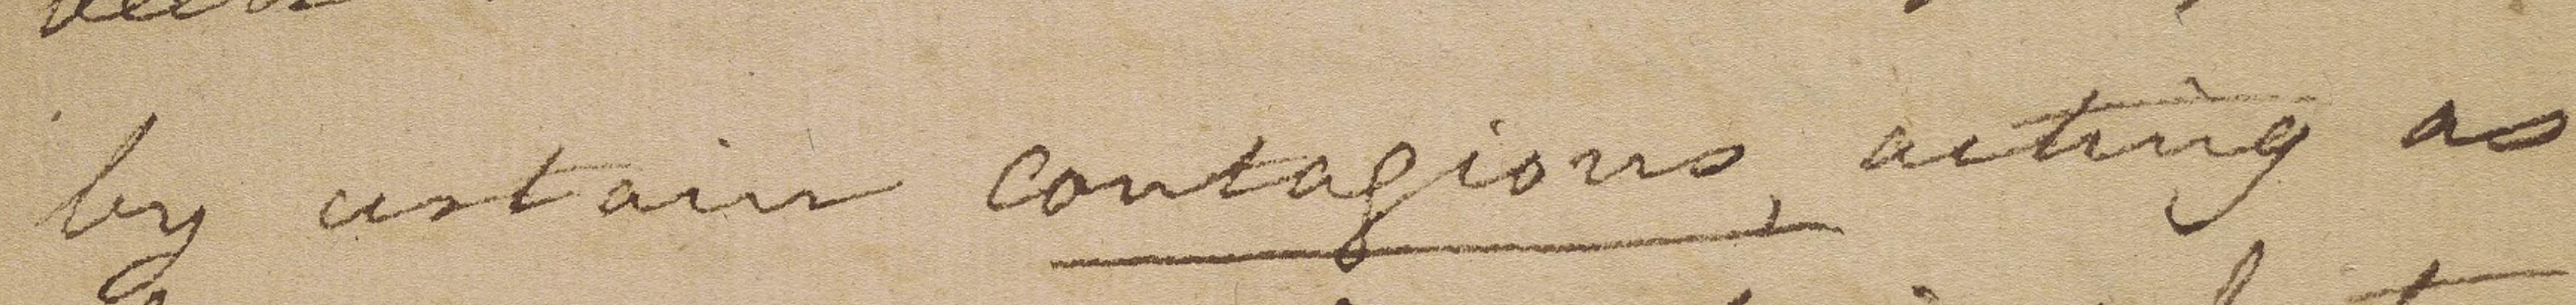by certain contagions, acting as
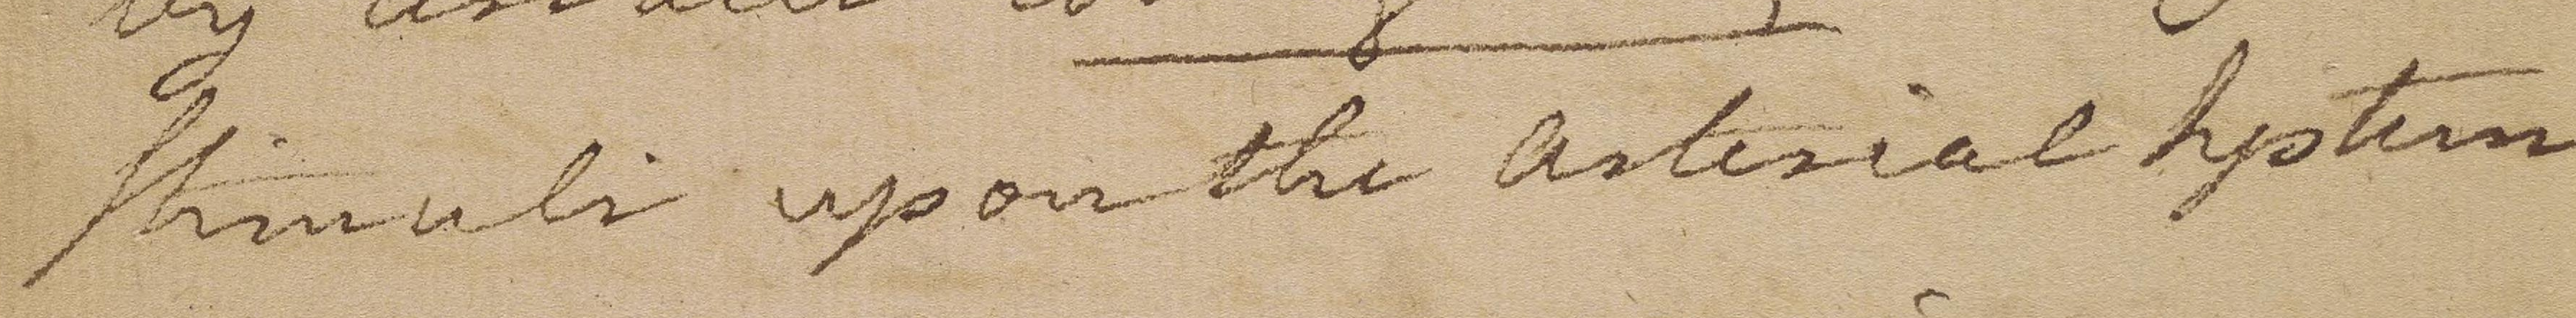Stimuli upon the arterial system.
